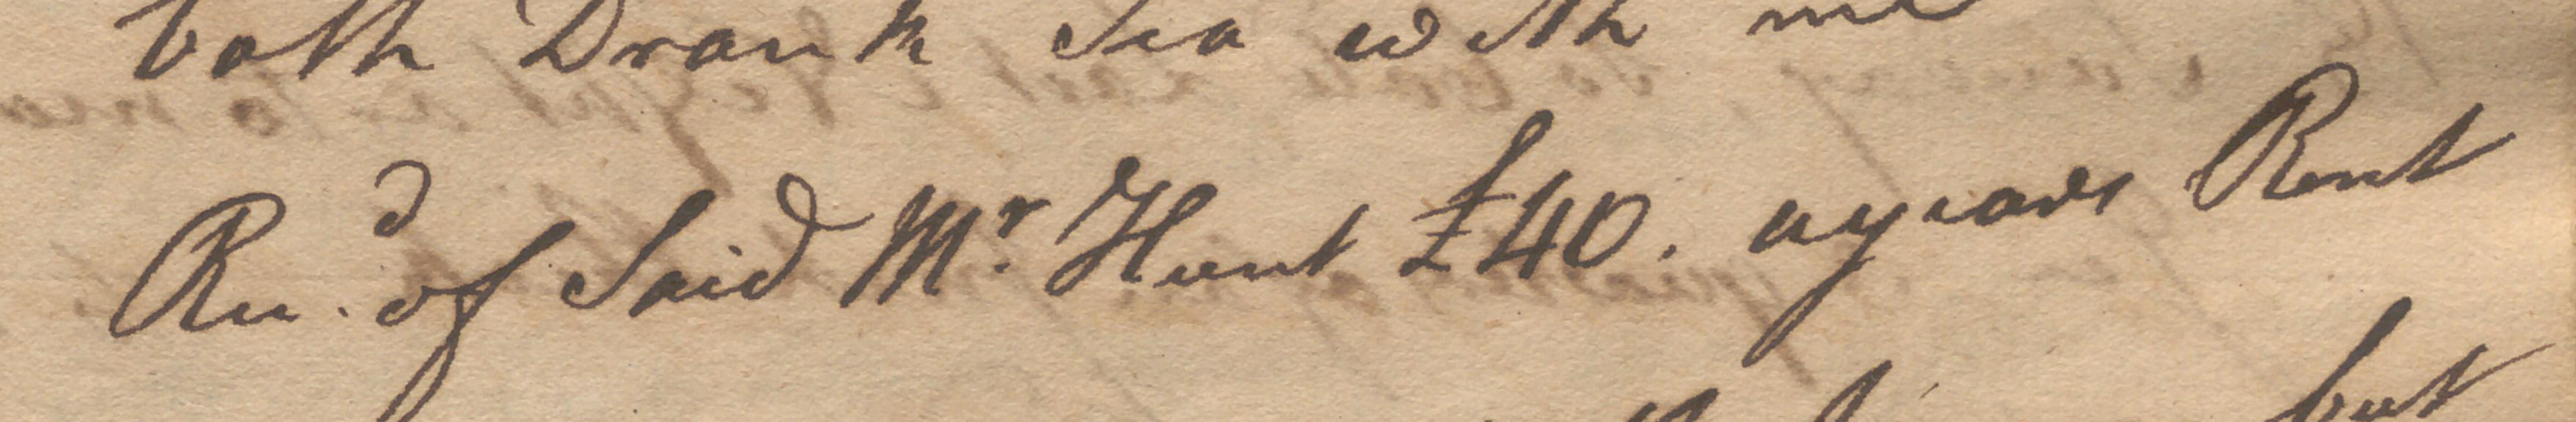Recd. of Said M^r. Hunt £40. a years Rent
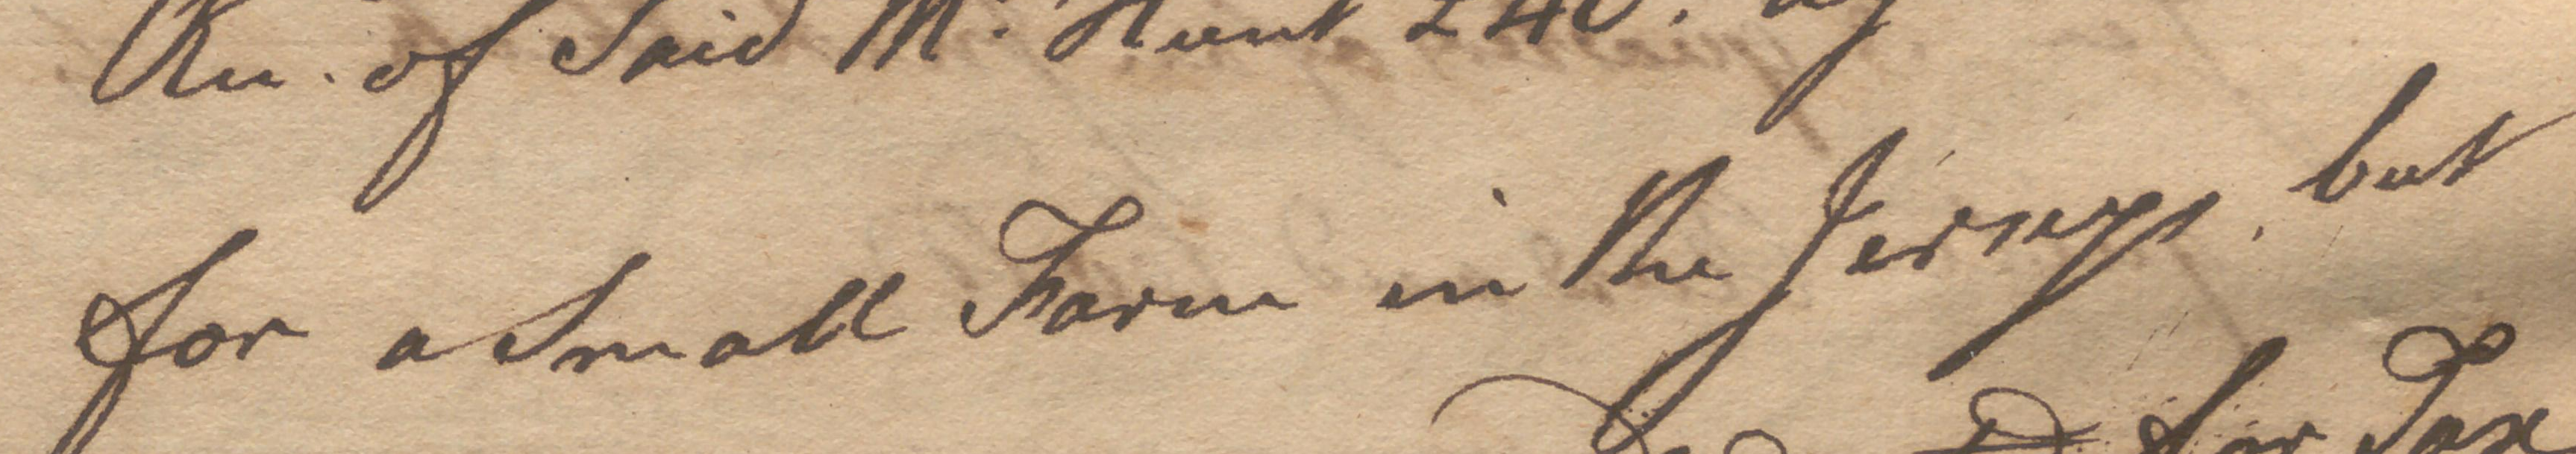for a small Farme in the Jerseys but
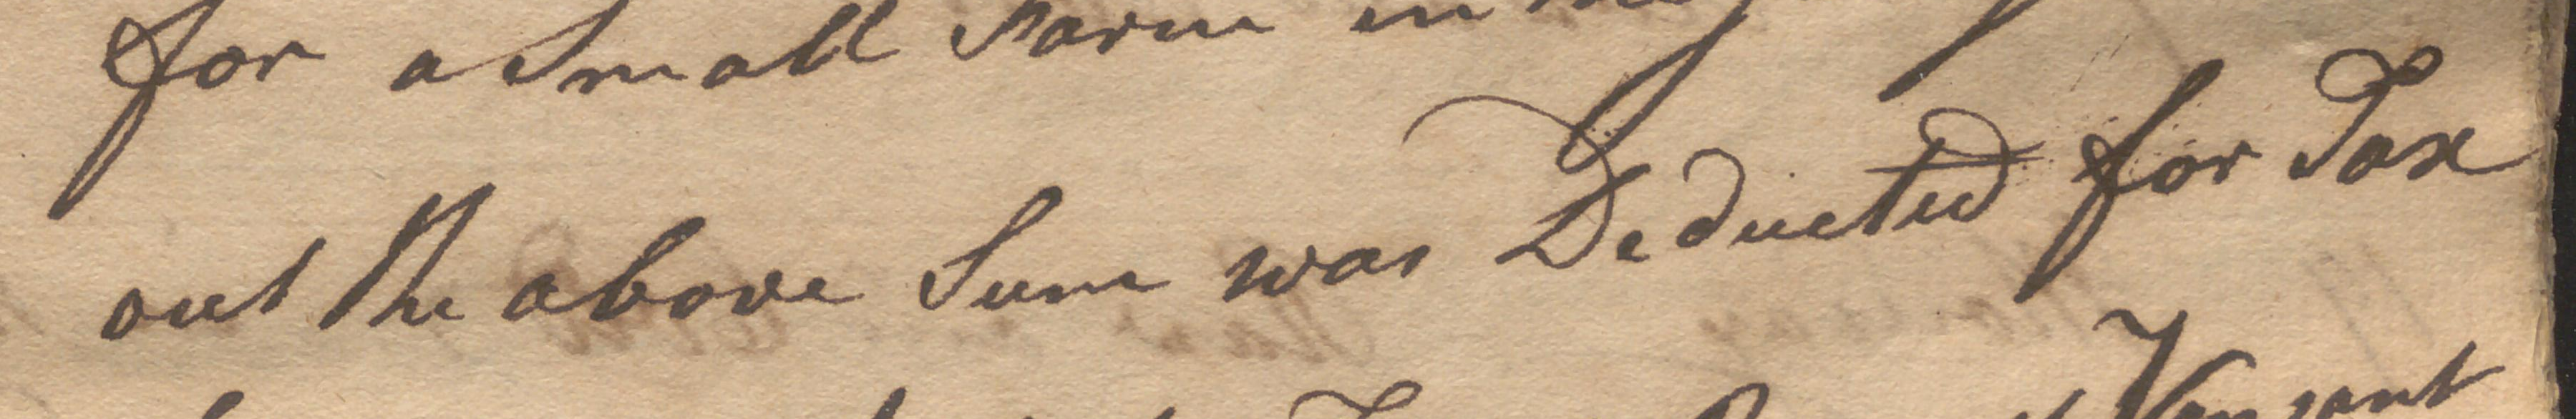out the above Sum was Deducted for Tax
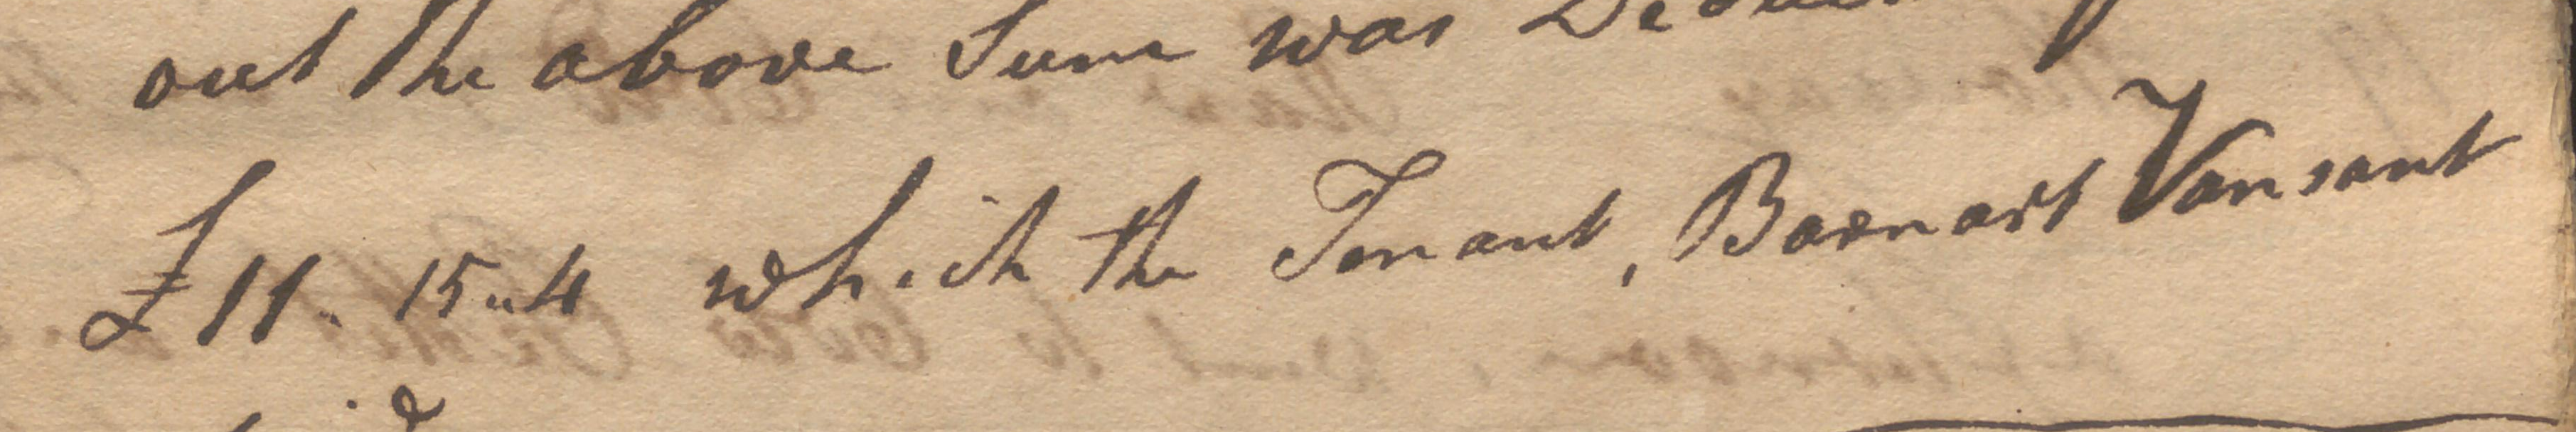£11.15..4 which the Tenant, Barnart Vansant
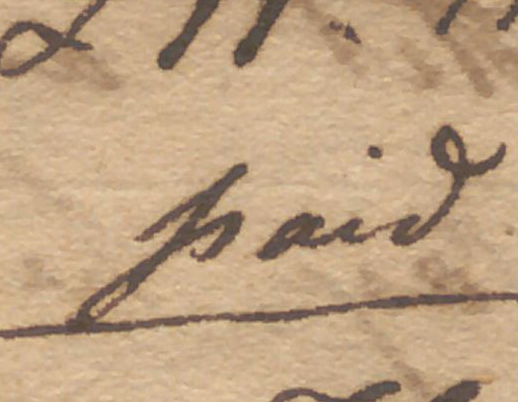paid
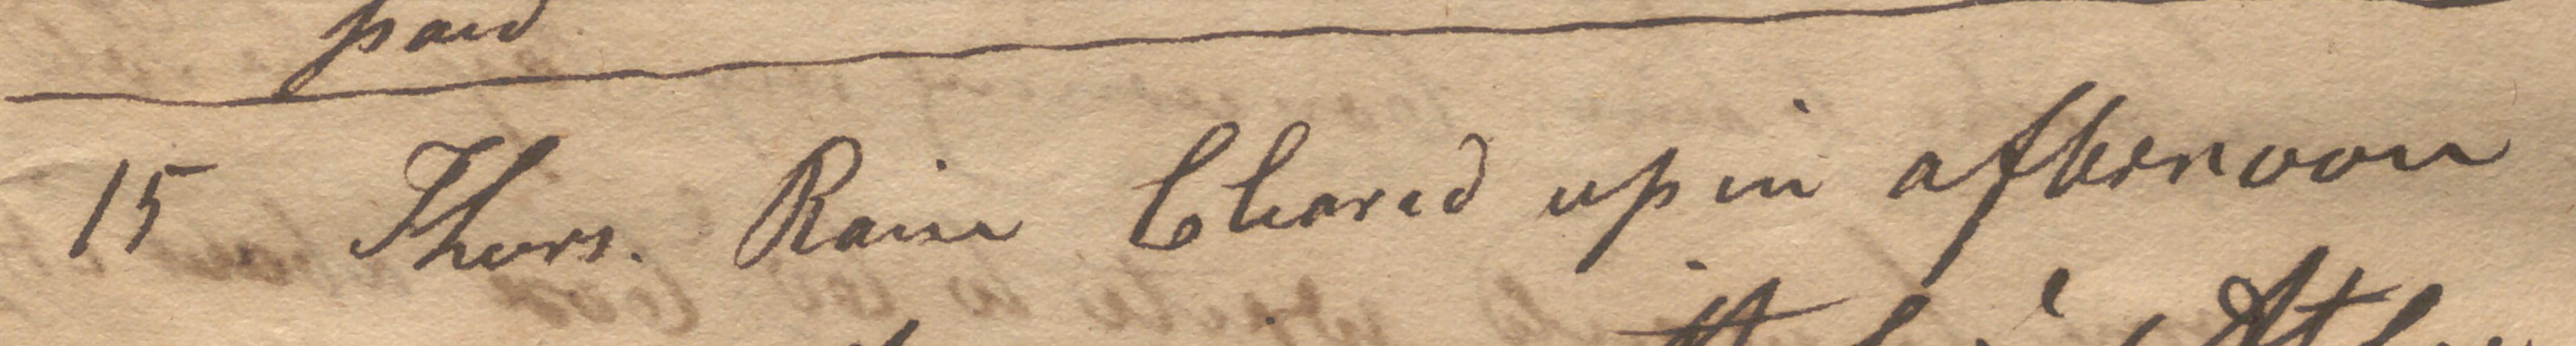15 Thurs Rain Cleased up in afternoon
